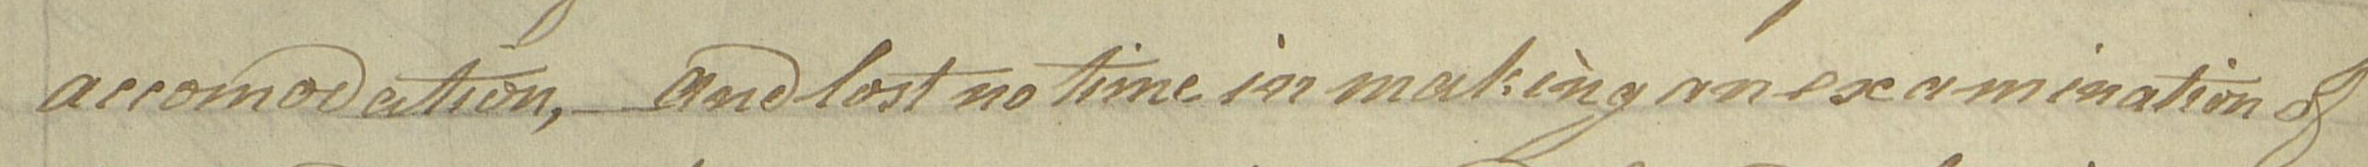accomodation, and lost no time in making in examination of
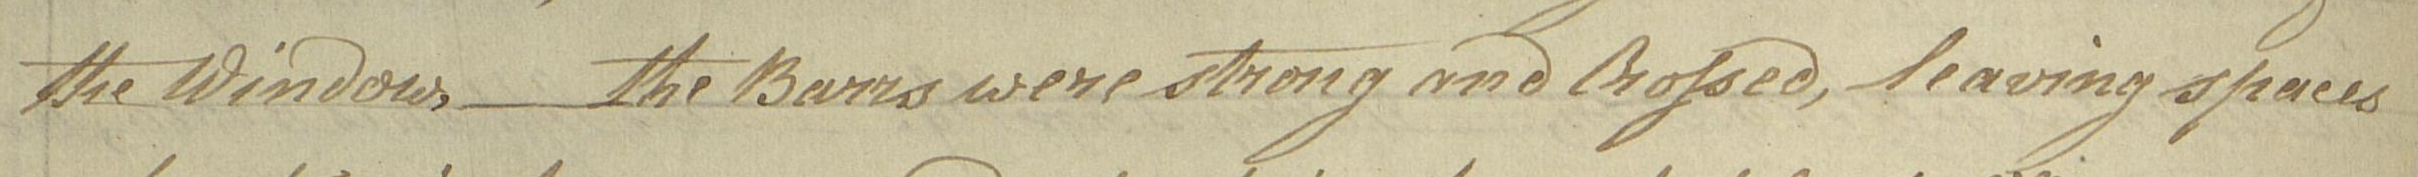the Window, the Barrs were strong and Crossed, leaving spaces
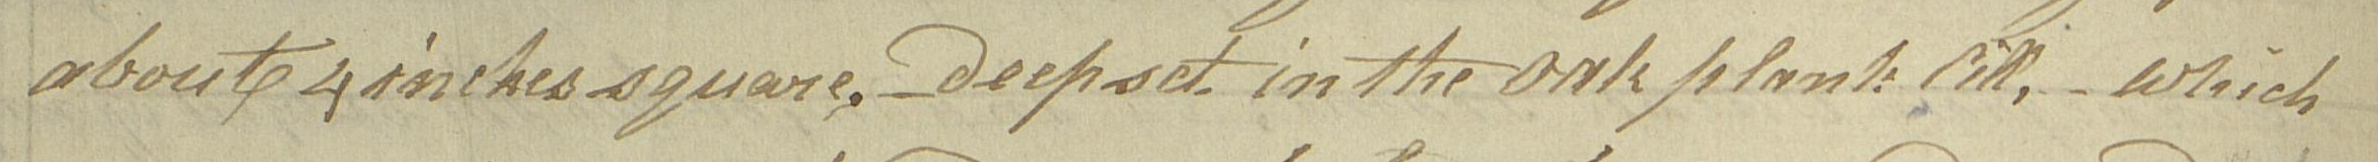about 4 inches square, deepset in the oak plank Cill, Which
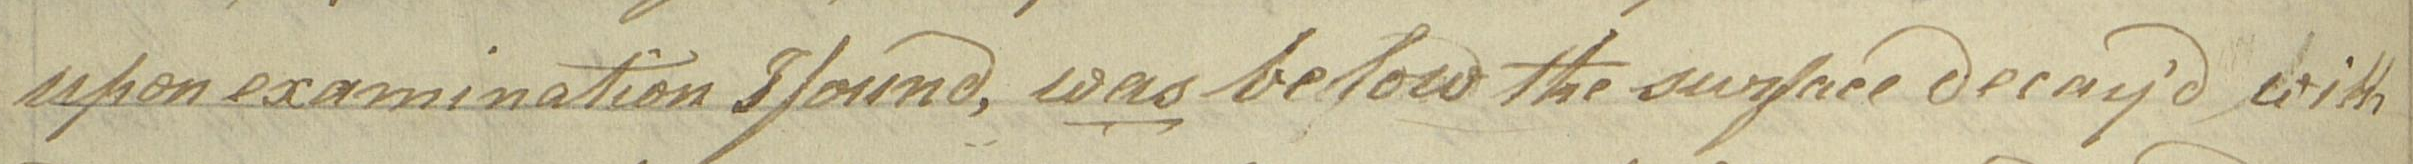upon examination I found, was below the surface decay'd with
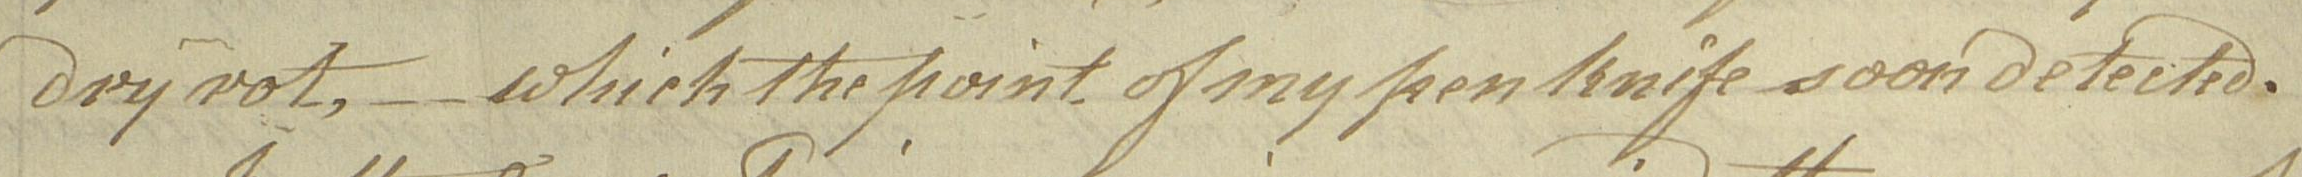dry rot, which the point of my pen knife soon detected.
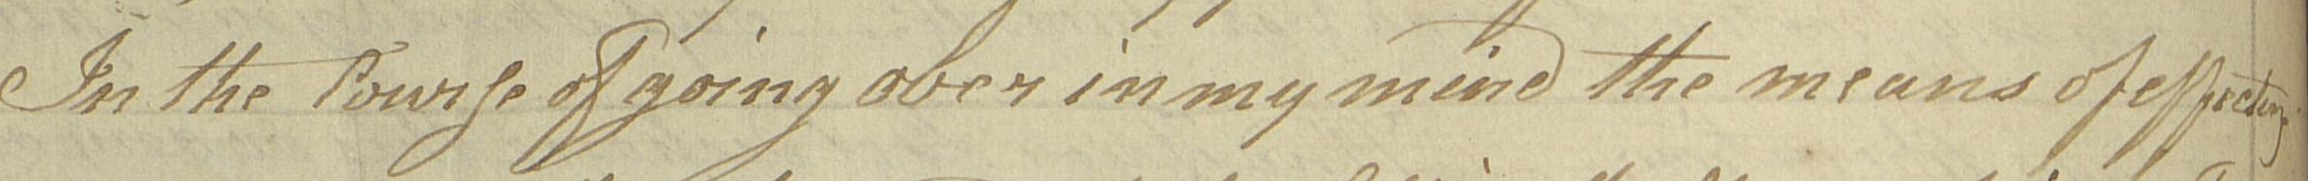In the Course of going over in my mind the means of effecting
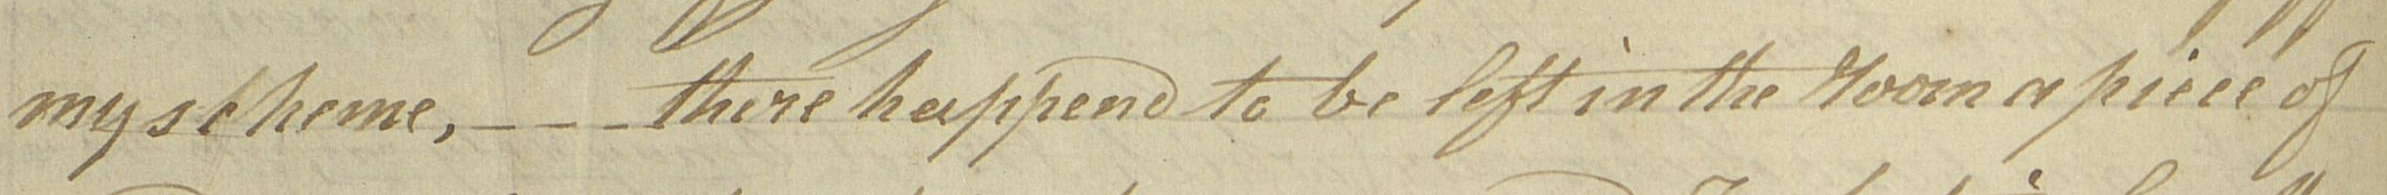my scheme, there happend to be left in the Room a piece of
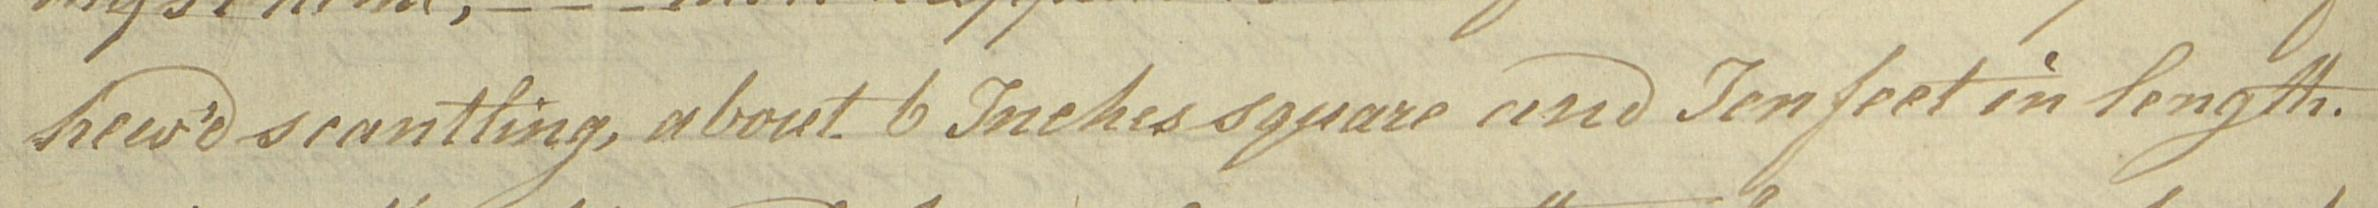hew'd scantling, about 6 Inches square and Ten feet in length.
